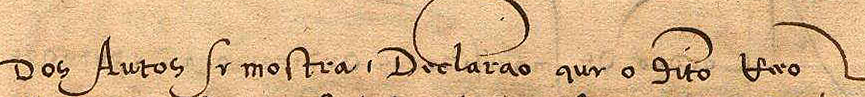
Dos Autos Se mostra / Declarão que o d̄ito Reo
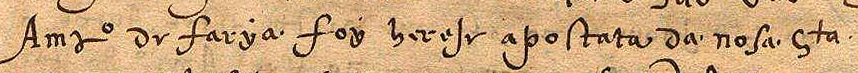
Amto de farya foy hereJe apostata da nosa Sta.
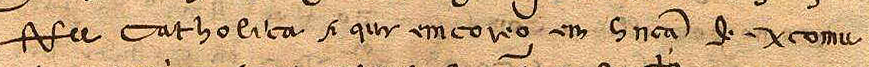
ffee Catholica e que emcoreo em Snçā de excomu
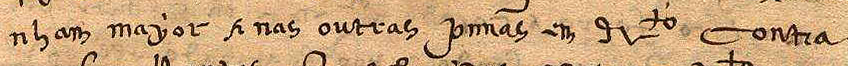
nham mayor e nas outras pnnās em drto Contra
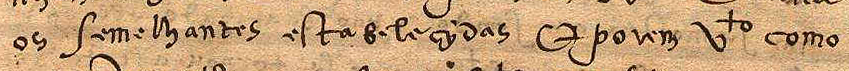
os Semelhantes estabelecydas E porem Vto como
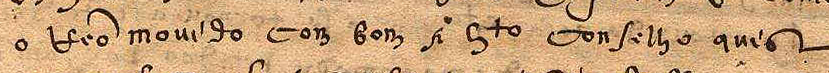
o Rēo mouido com bom e Sto conselho quis
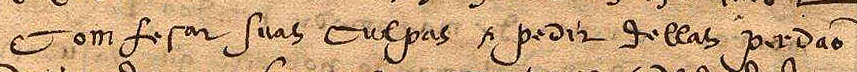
Comfesar Suas Culpas e pedir dellas perdaõ
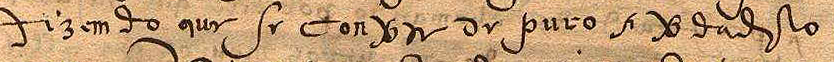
dizemdo que Se conꝟte de puro e ꝟdadjro
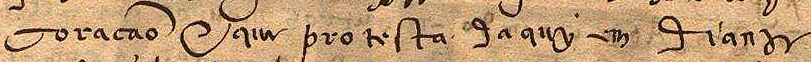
Coração e que protesta daquy em diante
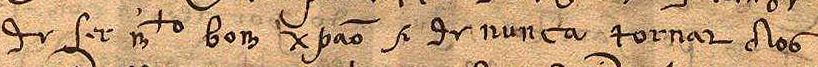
de ser mto bom xpão e de nunca tornar Aos
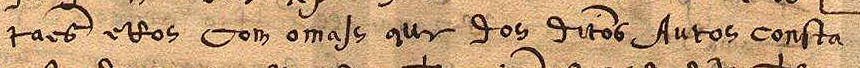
taēs eRos com o maJs que dos dītos Autos consta
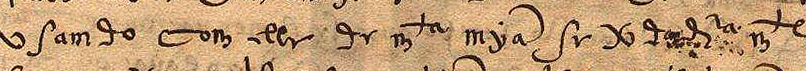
Vsamdo com elle de mta myā se ꝟdaderamte
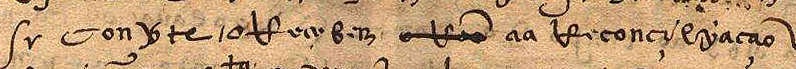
Se conꝟte / o Recebem o Rēo aa Reconcilyaçaõ
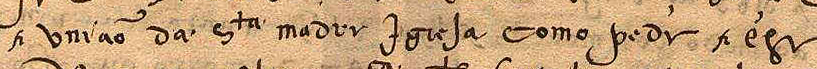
e vniaõ da Sta madre JgreJa como pede e lhe
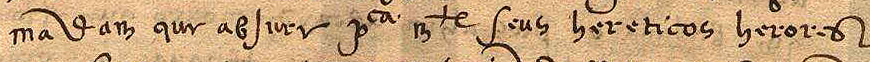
mādam que abJure pcamte seus hereticos herores
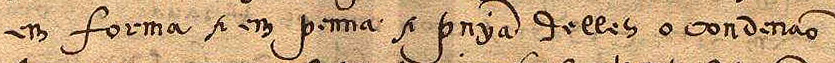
em forma e em penna e pnȳa delles o condenaõ
